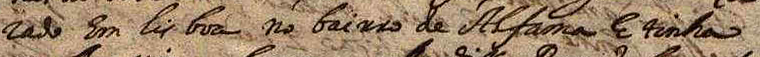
zado Em lisboa no bairro de Alfama E tinha
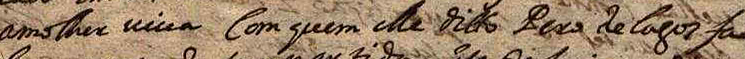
a molher uiua Com quem elle ditto Pero de lagos fa
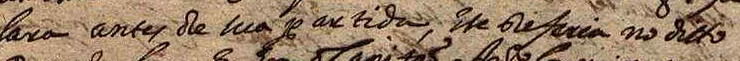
lara antes de sua partida, E se Referia no ditto
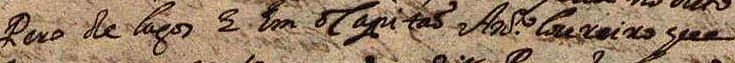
Pero de lagos E Em o Capitaõ An.to loureiro que
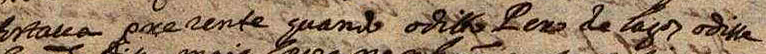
Estaua prezente quando o ditto Pero de lagos o disse
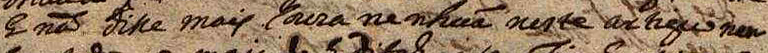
E não disse mais Couza nenhuā neste artiguo nem
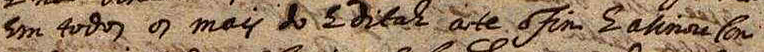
Em todos os mais do Edital ate o fim E asinou Con
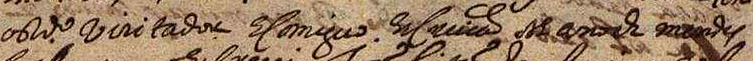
o R.do Vizitador e Comiguo EsCriuaõ Manoel mendes
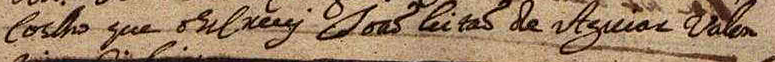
Coelho que o EsCreuj Ioaõ Leitaõ de Aguiar Valen
